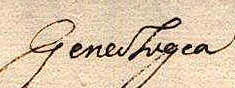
Genealogia
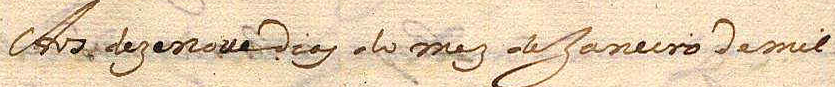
Aos dezenoue dias do mez de Janeiro de mil
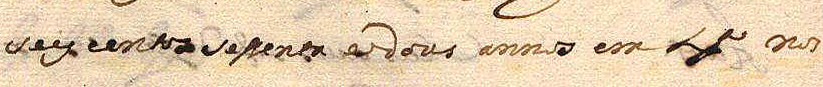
seiscentos sessenta e dous annos em Lxa nos
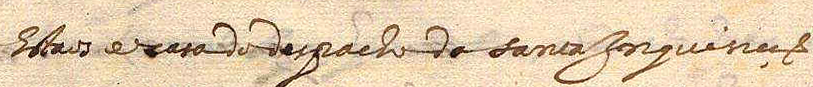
Estaos e casa do despacho da santa Jnquisiçaõ
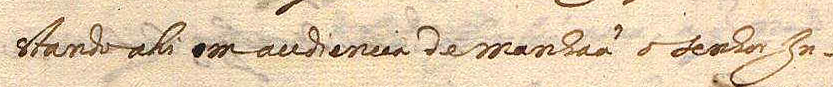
estando ahi em audiencia de manhaā o senhor Jn
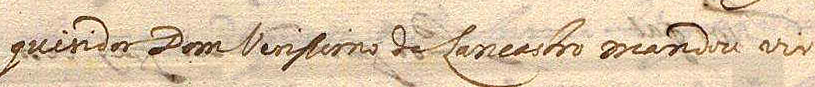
quisidor Dom Verissimo de Lancastro mandou vir
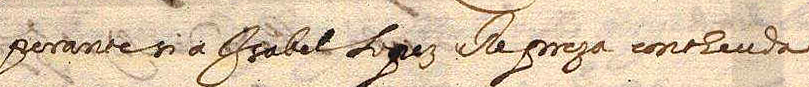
perante si a Jsabel Lopez Re preza contheuda
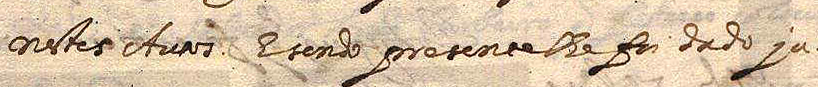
nestes Autos. E sendo presente lhe foi dado ju
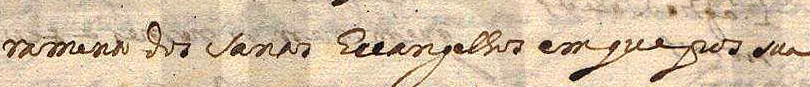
ramento dos Santos Euangelhos em que pos sua
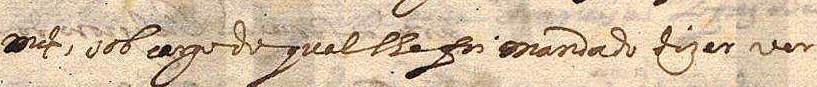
maõ, sob cargo do qual lhe foi mandado dizer ver
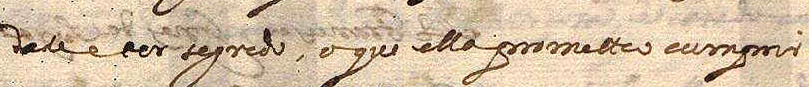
dade e ter segredo, o que ella prometteo cumprir
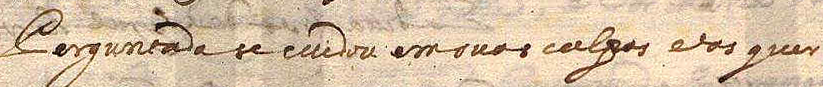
Perguntada se cuidou em suas culpas e as quer
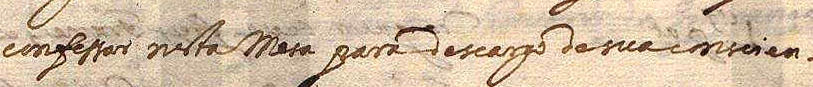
confessar nesta Mesa para descargo de sua conscien
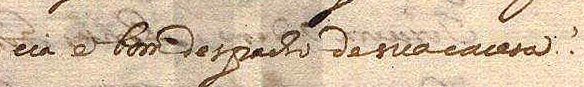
cia e bom despacho de sua causa?
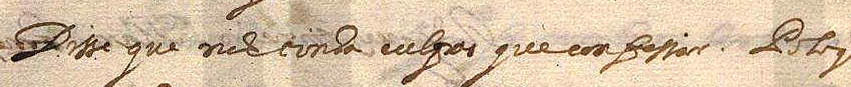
Disse que naõ tinha culpas que confessar. Polo q̄
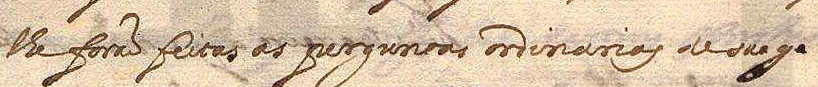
lhe foraõ feitas as perguntas ordinarias de sua ge
